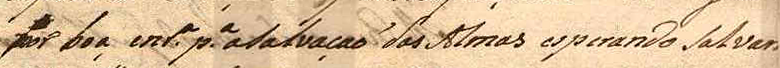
por boa, enr.a p.a a salvaçaõ das Almas esperando salvar
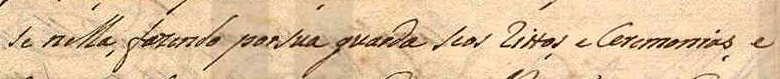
se nella, fazendo por sua guarda seos Rittos, e Ceremonias, e
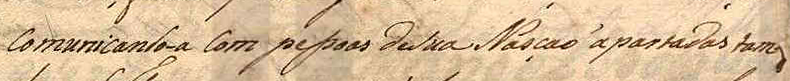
comunicando-a com pessoas de sua Nasçaõ apartadas tam
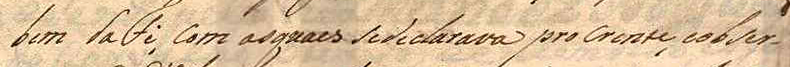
bem da Fé, com as quaes se declarava pro crente, e obser
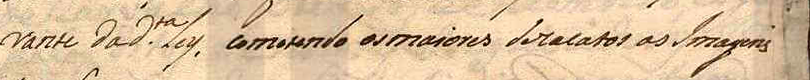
vante da d.ta ley, cometendo os maiores dezacatos as Imagens
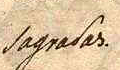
sagradas.
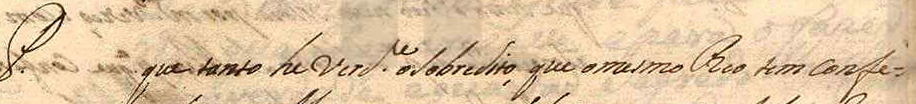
P. que tanto he verd.a o sobredito, que o mesmo Reo tem confe
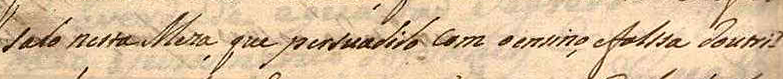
sado nesta Meza, que persuadido com o ensino, e falssa doutri
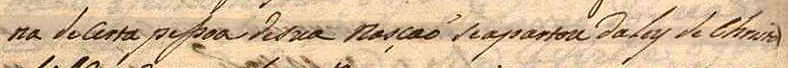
na de certa pessoa de sua nasçaõ se apartou da ley de Christo
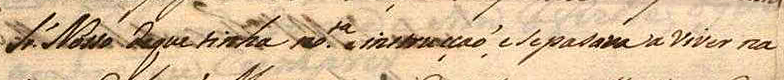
Sr̄. Nosso de que tinha no.ta e instrucçaõ, e se pasava a viver na
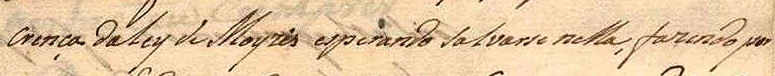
crença da Ley de Moyzés esperando salvarse nella, fazendo por
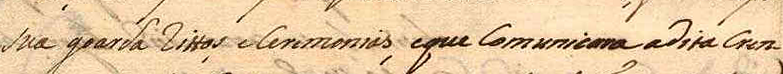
sua goarda Rittos, e Ceremonias, e que Comunicara a dita cren
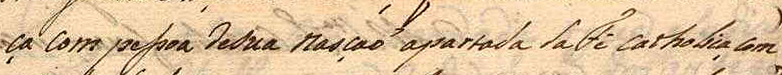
ça com pessoa de sua nasçaõ apartada da Fé catholica, com
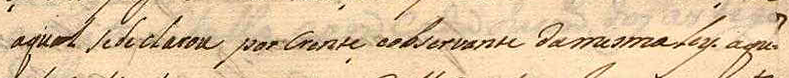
a qual se declarou por crente, e observante da mesma Ley a qu
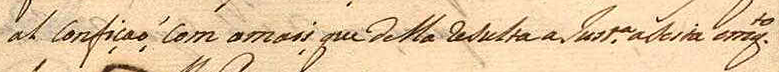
al confiçaõ, com o mais, que della Resulta a Iust.a aseita emqto;
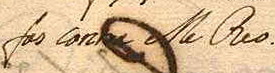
fas contra elle Reo.
